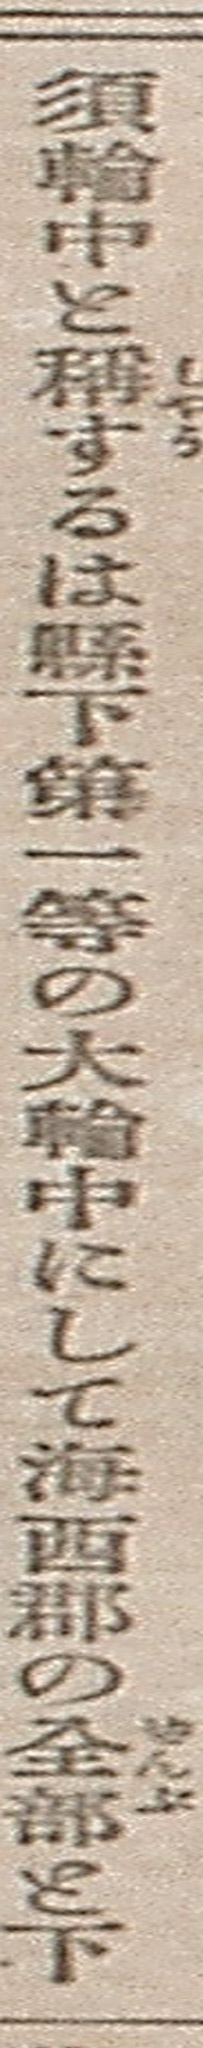須輪中と称する県下第一等の大輪中にして海西郡の全部と下
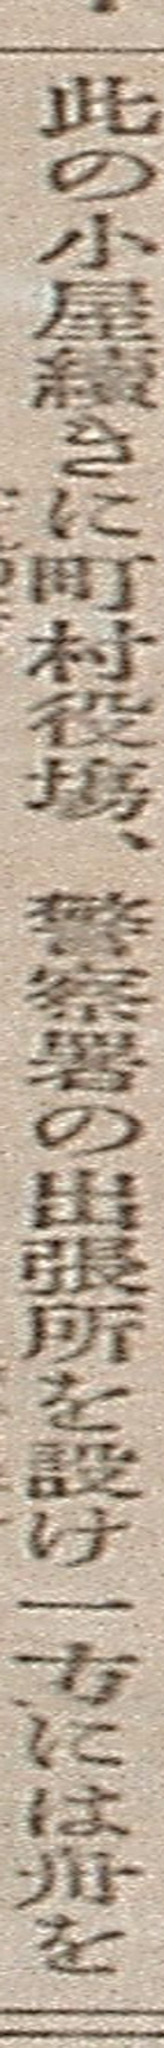此の小屋続きに町村役場、警察署の出張所を設け一方には舟を
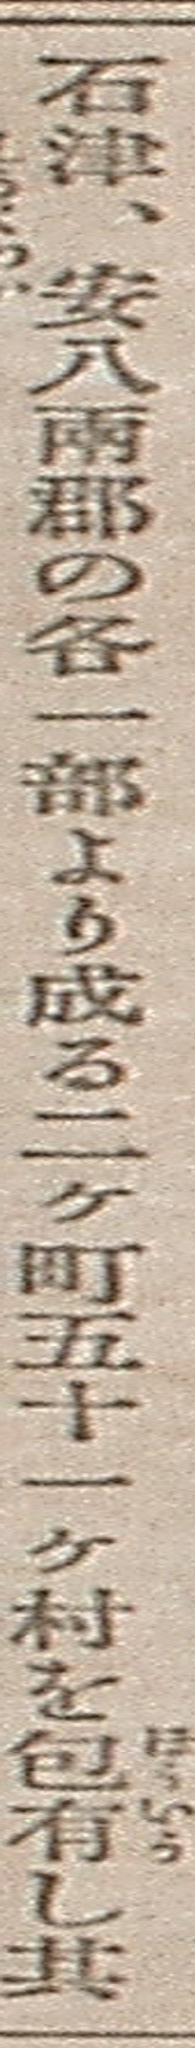石津、安八両郡の各一部より成る二ヶ町五十一ヶ村を包有し其
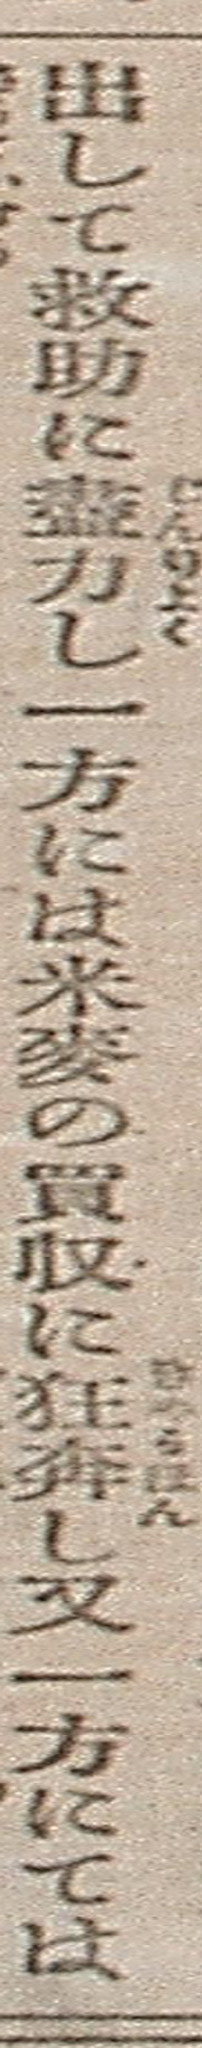出して救助に尽力し一方には米麦の買収に狂奔し又一方にては
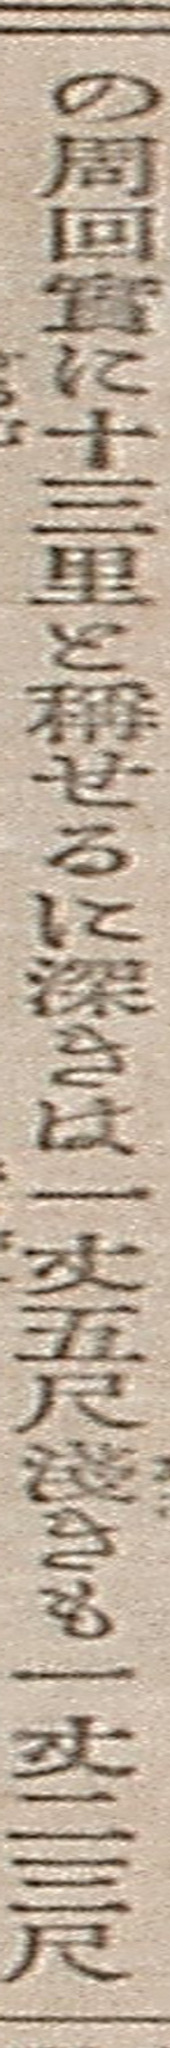の周回実に十三里と称せるに深さは一丈五尺浅さも一丈二三尺
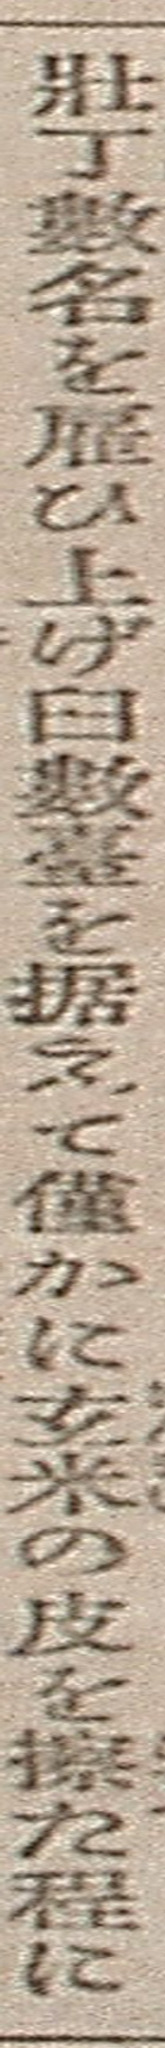壮丁数名を雇ひ上が𦥑数台を据へて僅かに玄米の皮を擦た程に
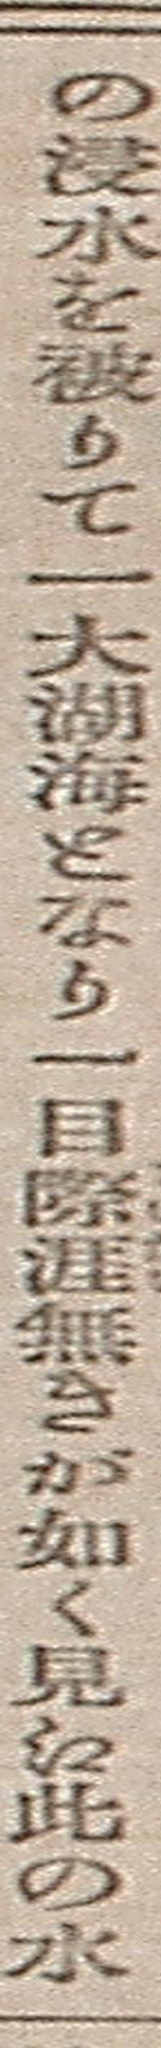の浸水を被りて一大湖海となり一目際涯無きが如く見江此の水
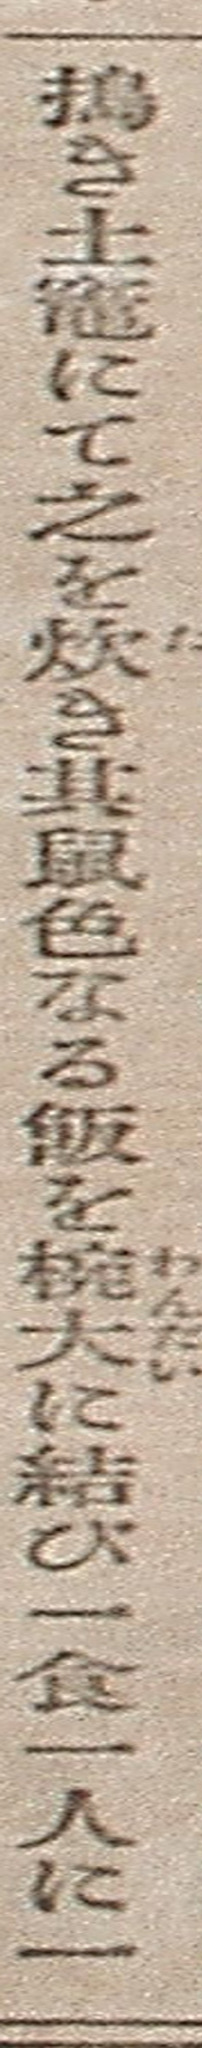搗き土竈にて之を炊き其鼠色なる飯を椀大に結び一食一人に一

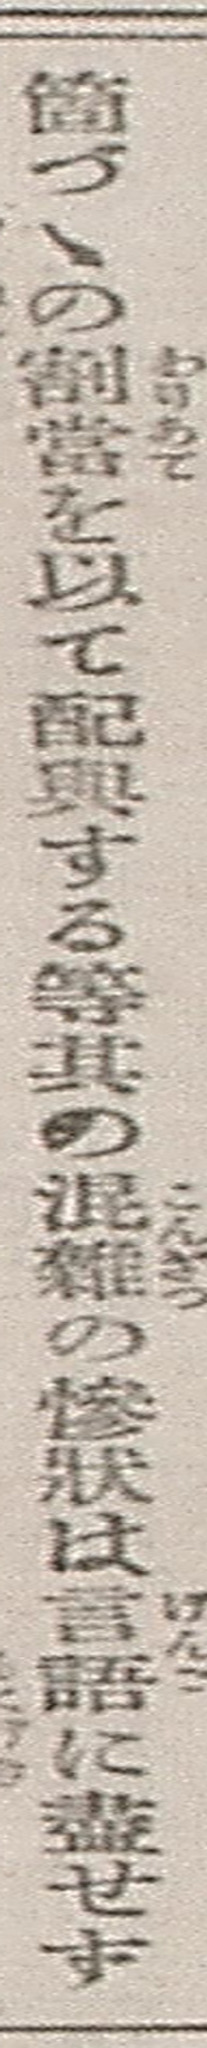箇づゝの割当を以て配輿する等其の混雑の惨状は言語に盡せず
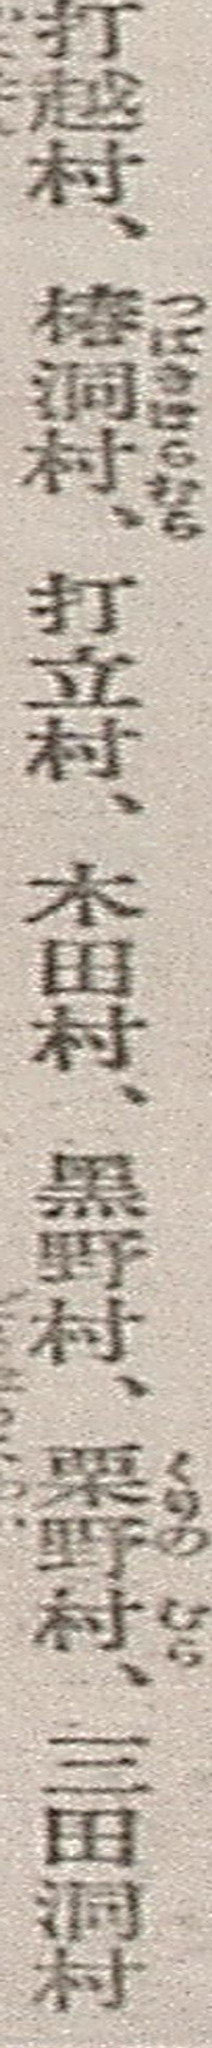打越村、椿洞村、打立村、木田村、黒野村、栗野村、三田洞村
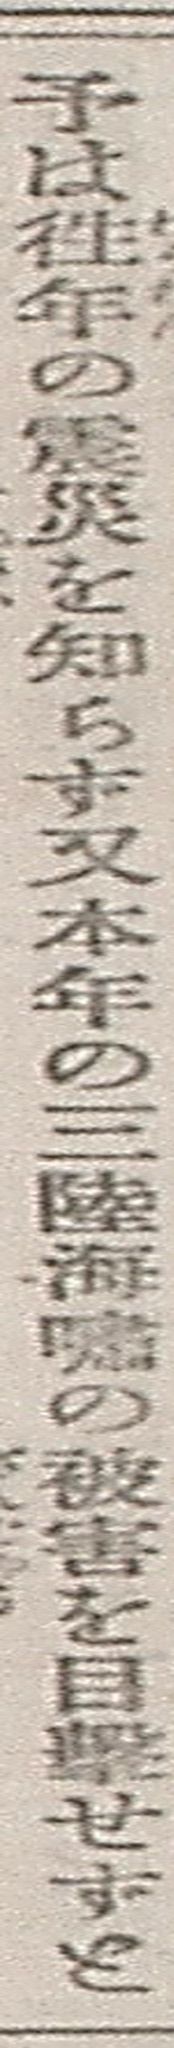予は往年の震災を知らず又本年の三陸津嘯の被害を目撃せずと
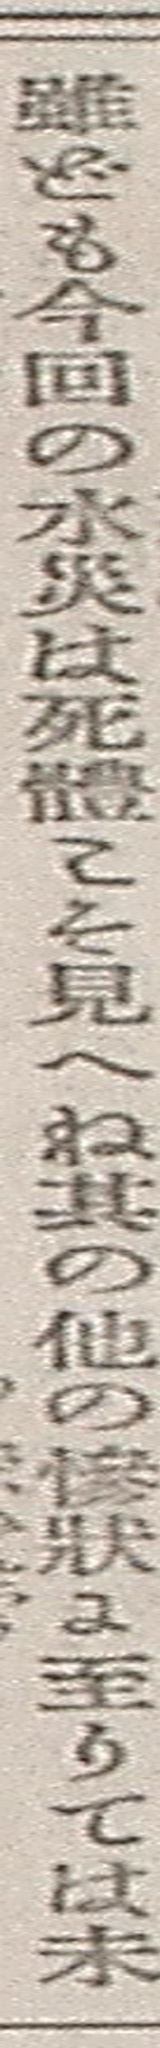雖ども今回の水災は死体こそ見へね其の他の惨状に至りては未
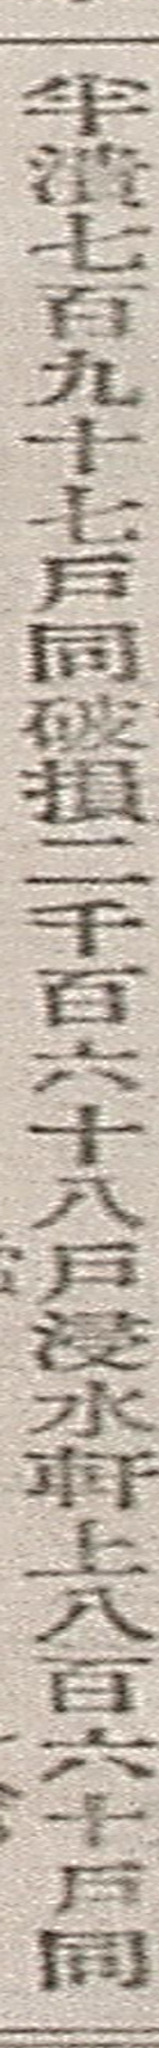半潰七百九十七戸同破損二千百六十八戸浸水軒上八百六十戸同
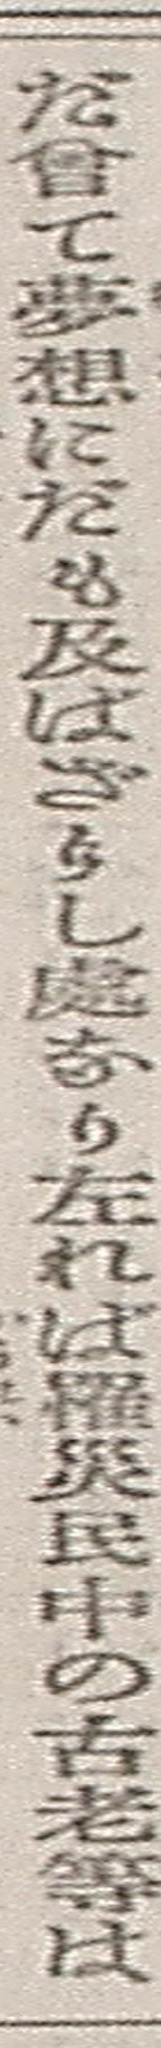だ曾て夢想にだも及ばざりし処なり左れば罹災民中の古老等は
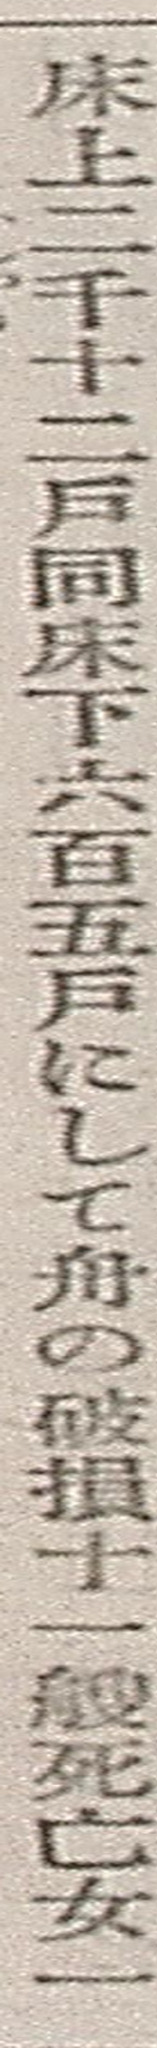床上二千十二戸同床下六百五戸にして舟の破損十一艘死亡女一
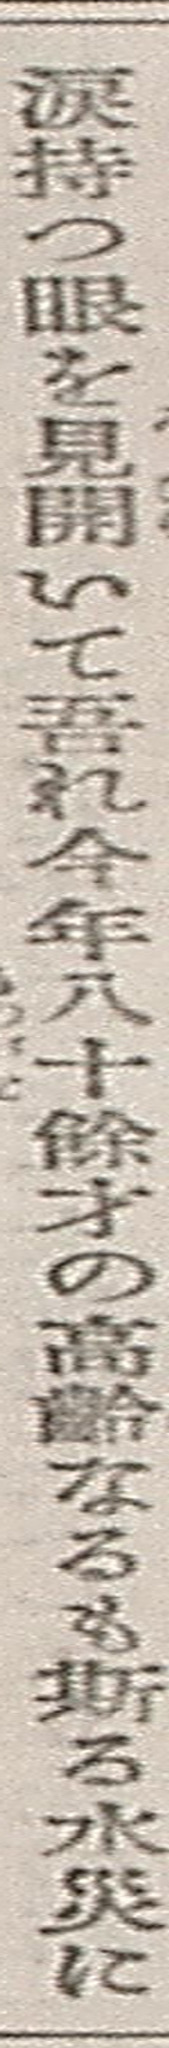涙持つ眼を見開いて吾れ今年八十餘才の高齢なるも斯る水災に
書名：風俗畫報臨時増刊第百二十六號　洪水被害録（中）
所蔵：東京大学地震研究所図書室 Earthquake Research Institute Library, The University of Tokyo, JAPAN
